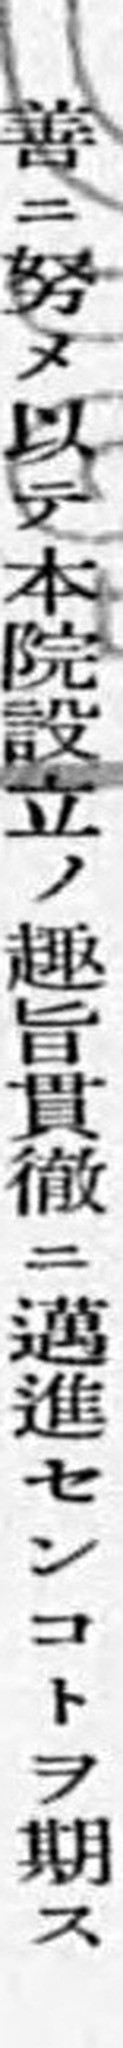善ニ努メ以テ本院設立ノ趣旨貫徹ニ邁進センコトヲ期ス
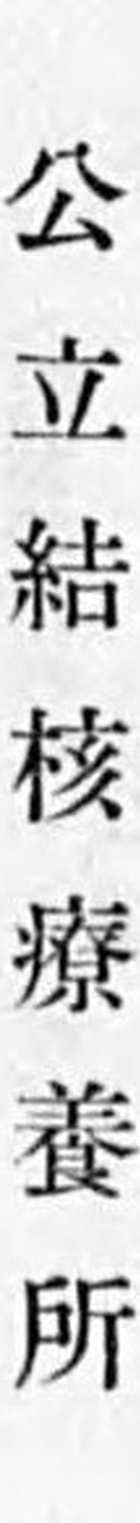公立結核療養所
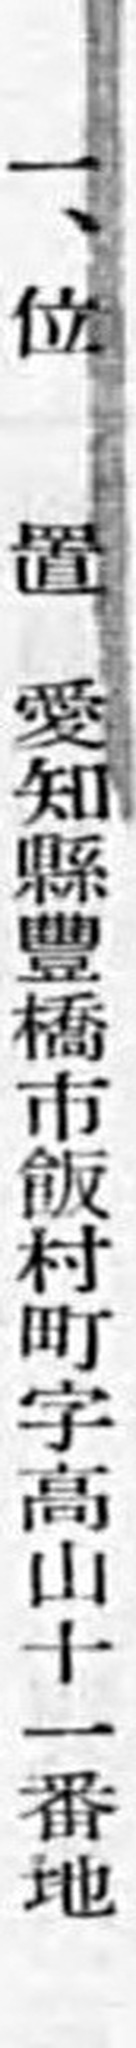一、位置愛知縣豊橋市飯村町字高山十一番地
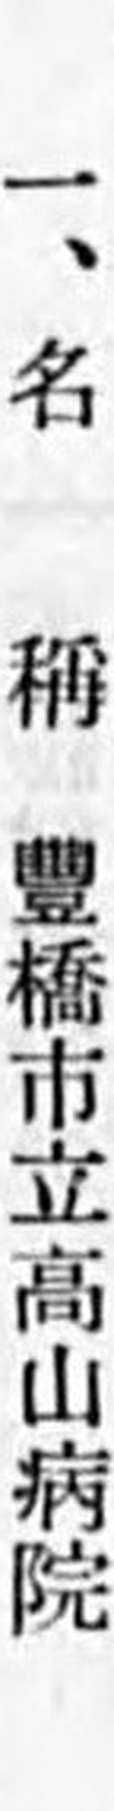一、名稱豊橋市立高山病院
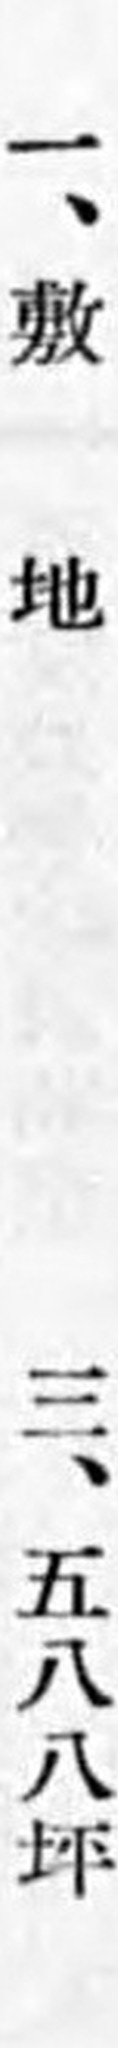一、敷地三、五八八坪

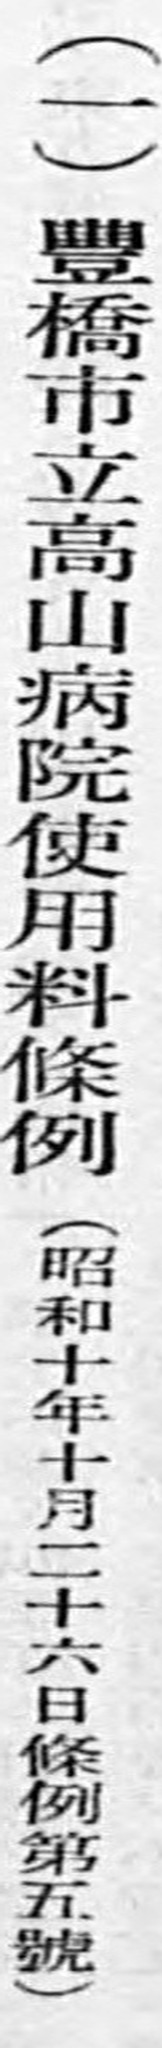(一)豊橋市立高山病院使用料条例(昭和十年十月二十六日条例第五号)
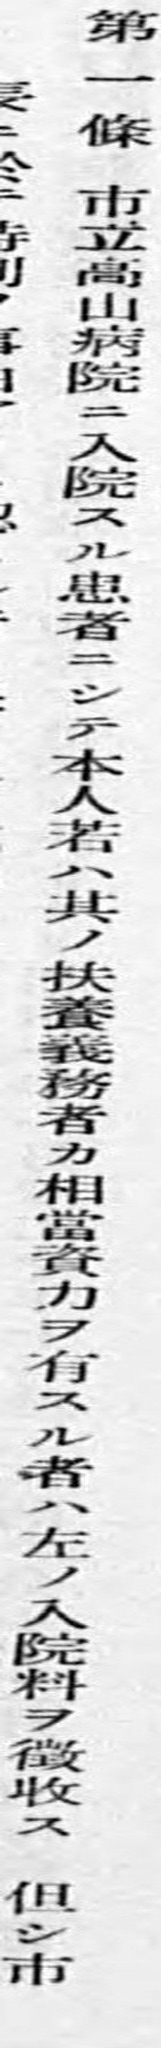第一条市立高山病院ニ入院スル患者ニシテ本人若ハ其ノ扶養義務者カ相当資力ヲ有スル者ハ左ノ入院料ヲ徴収ス但シ市
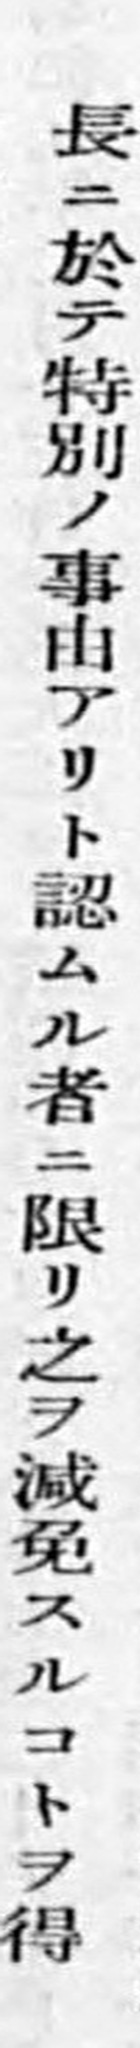長ニ於テ特別ノ事由アリト認ムル者ニ限リ之ヲ減免スルコトヲ得
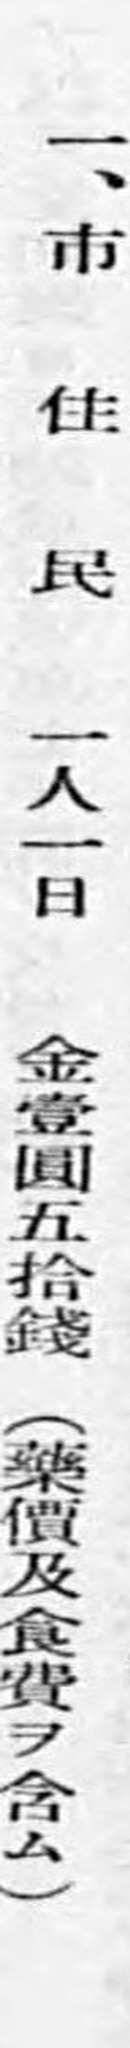一、市住民一人一日金壱円五拾銭(薬価及食費ヲ含ム)
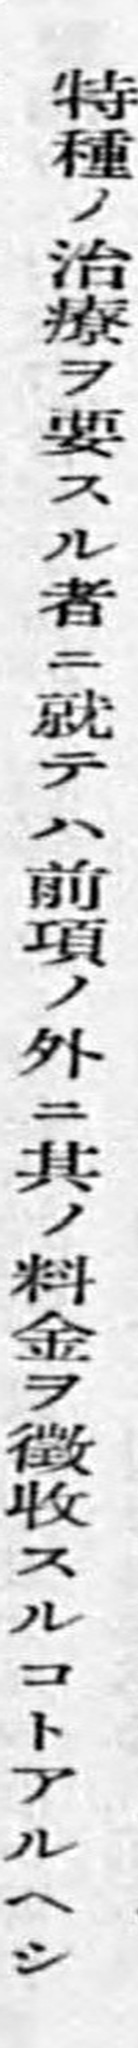特種ノ治療ヲ要スル者ニ就テハ前項ノ外ニ其ノ料金ヲ徴収スルコトアルヘシ
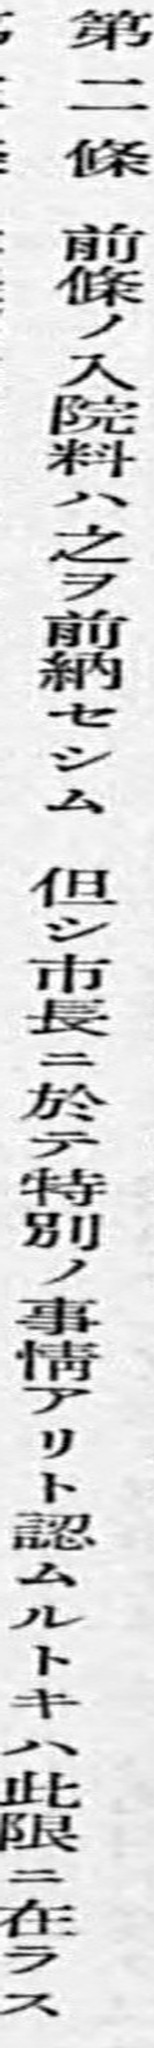第二条前条ノ入院料ハ之ヲ前納セシム但シ市長ニ於テ特別ノ事情アリト認ムルトキハ此限ニ在ラス
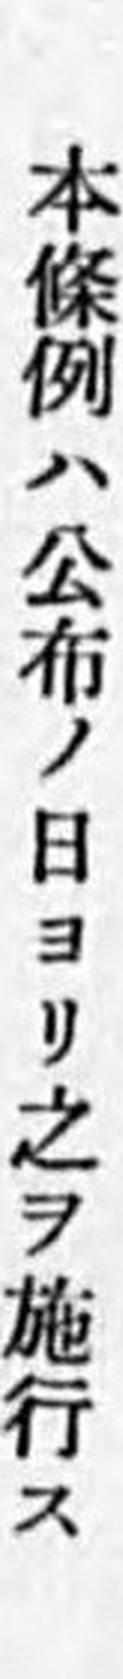本条例ハ公布ノ日ヨリ之ヲ施行ス
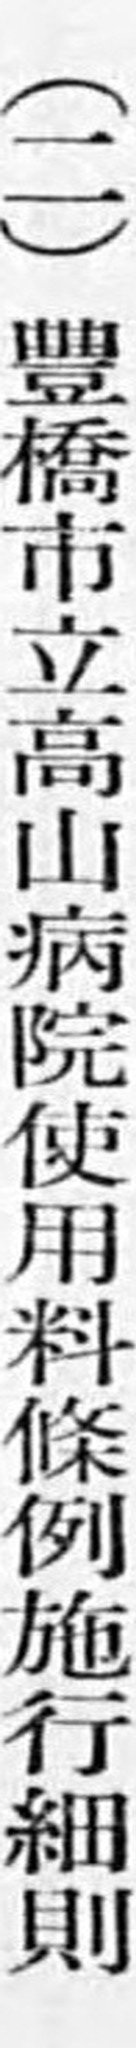(二)豊橋市立高山病院使用料条例施行細則
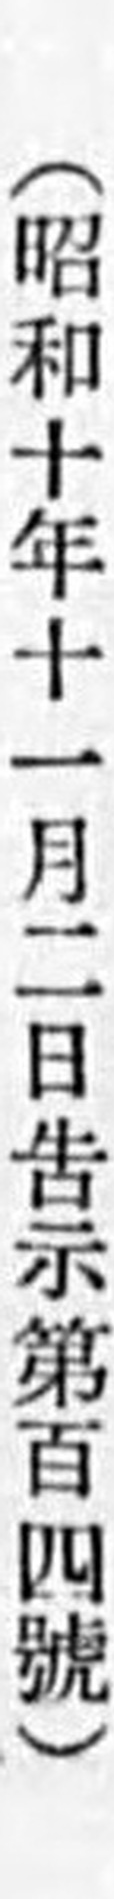(昭和十年十一月二日告示第百四号)
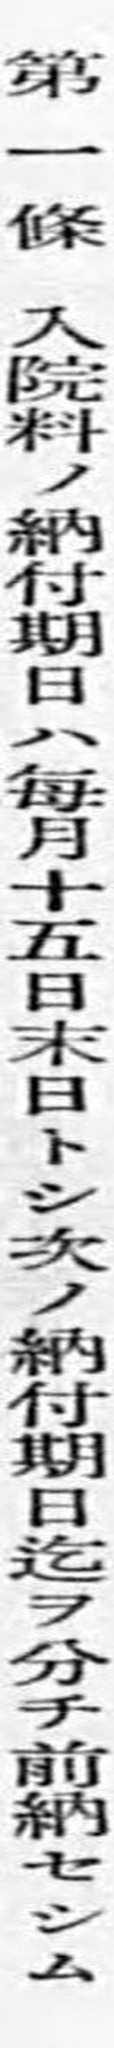第一条入院料ノ納付期日ハ毎月十五日末日トシ次ノ納付期日迄ヲ分チ前納セシム
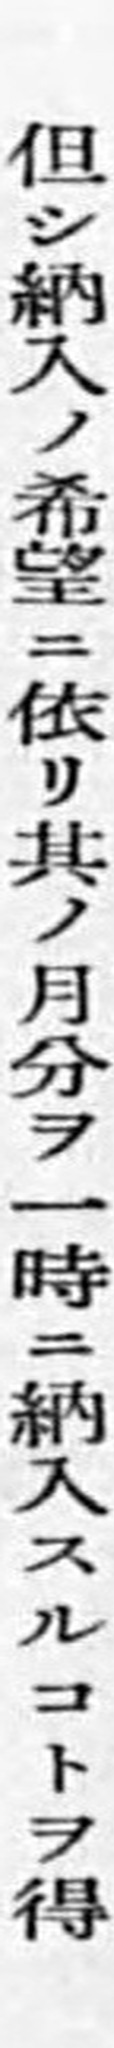但シ納入ノ希望ニ依リ其ノ月分ヲ一時ニ納入スルコトヲ得
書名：豊橋市立高山病院年報. 昭和12年度
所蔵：国立国会図書館 National Diet Library, JAPAN
